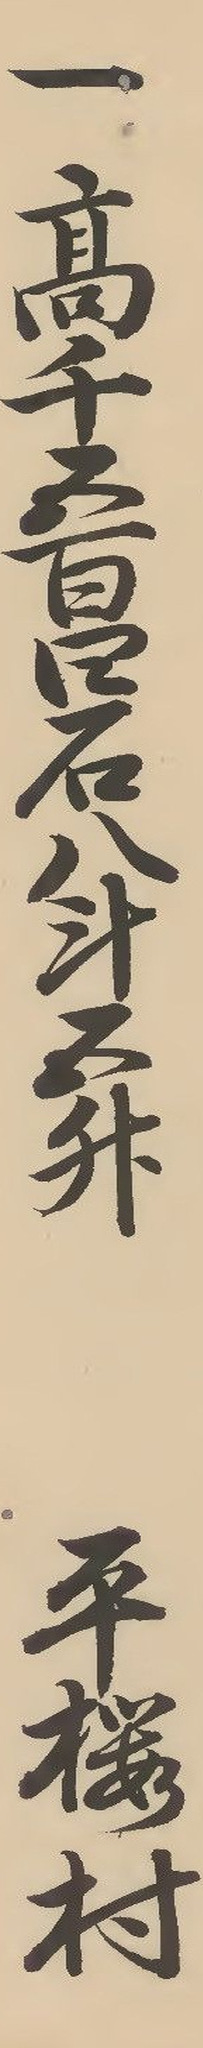一高千五百四石八斗五升平桜村
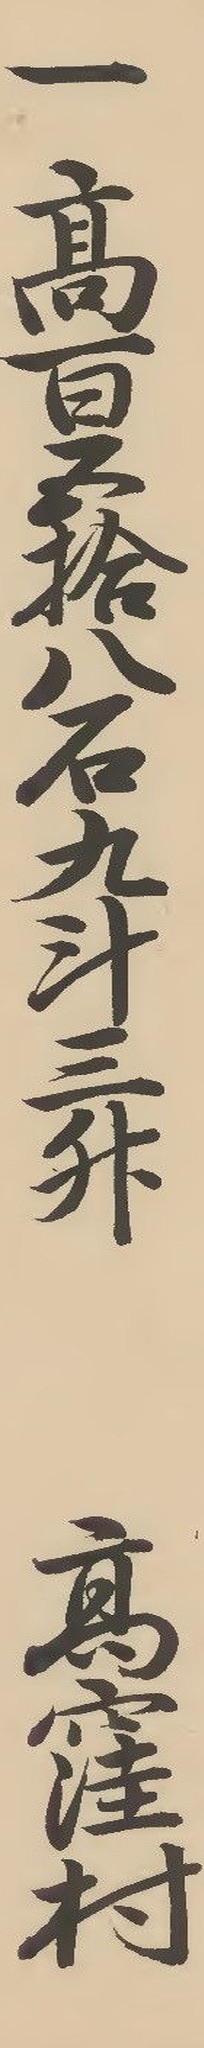一高百五拾八石九斗三升高窪村

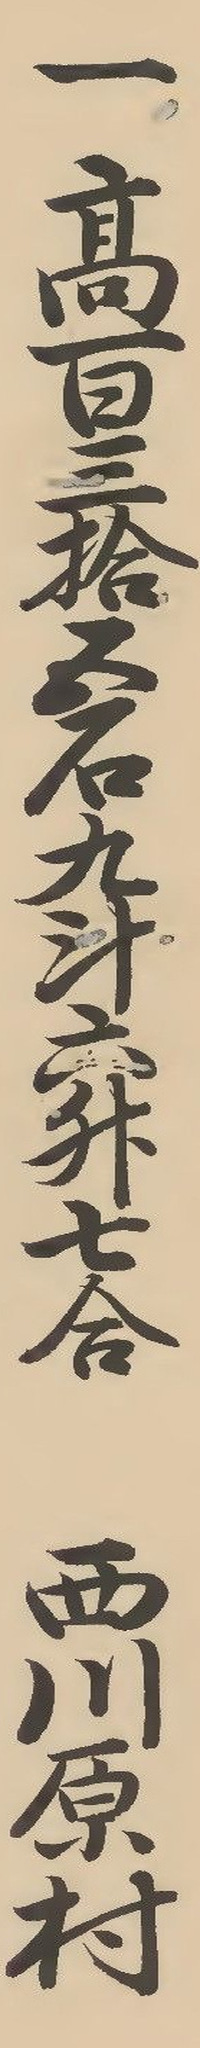一高百三拾五石九斗六升七合西川原村
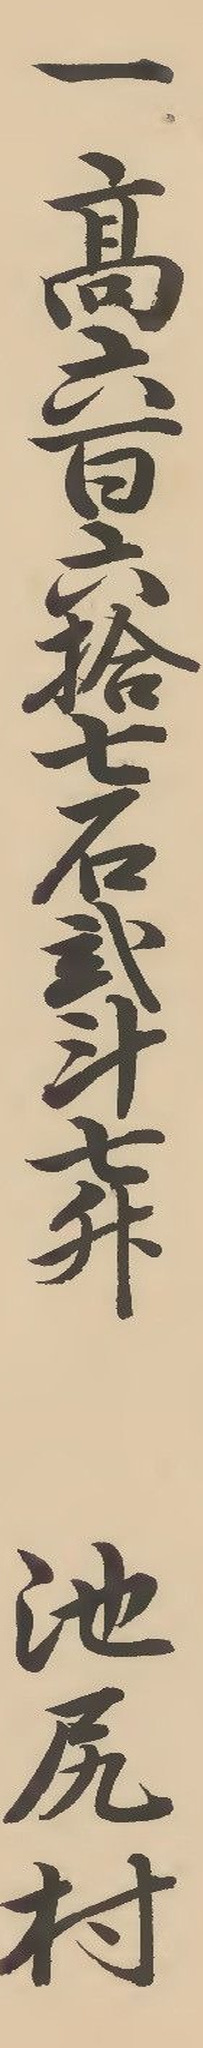一高六百六拾七石弐斗七升池尻村
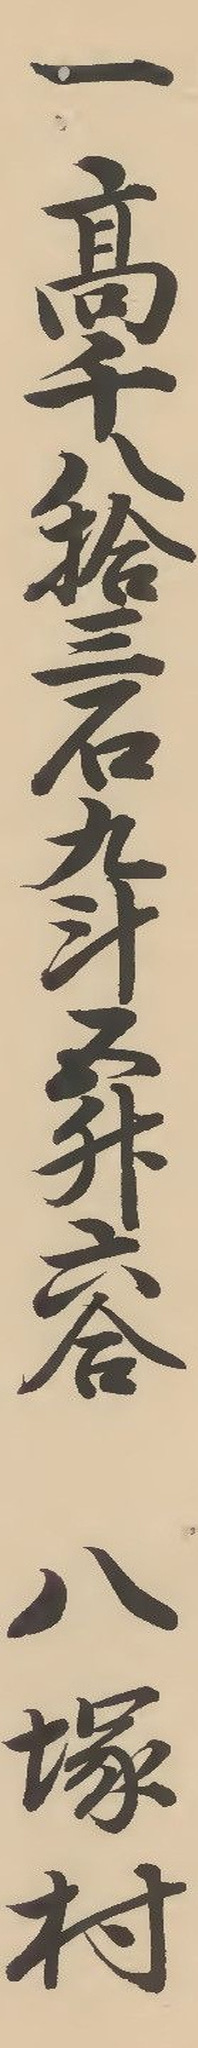一高千八拾三石九斗五升六合八塚村
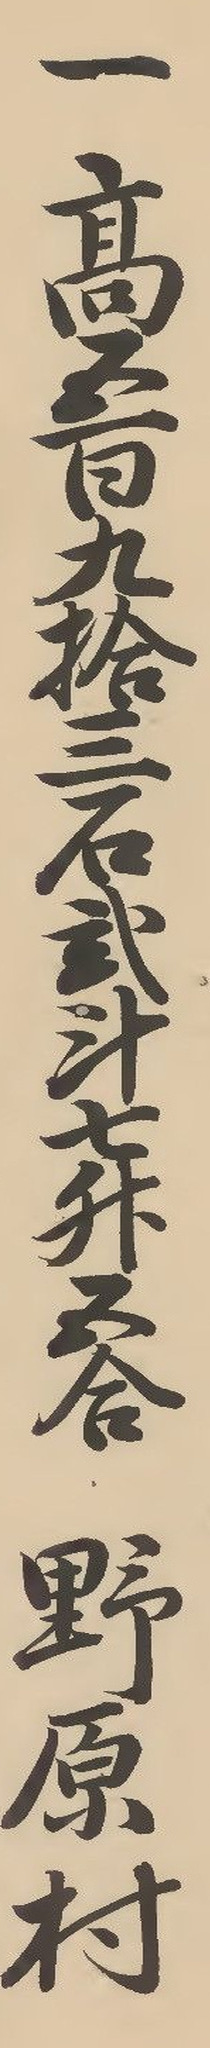一高五百九拾三石弐斗七升五合野原村
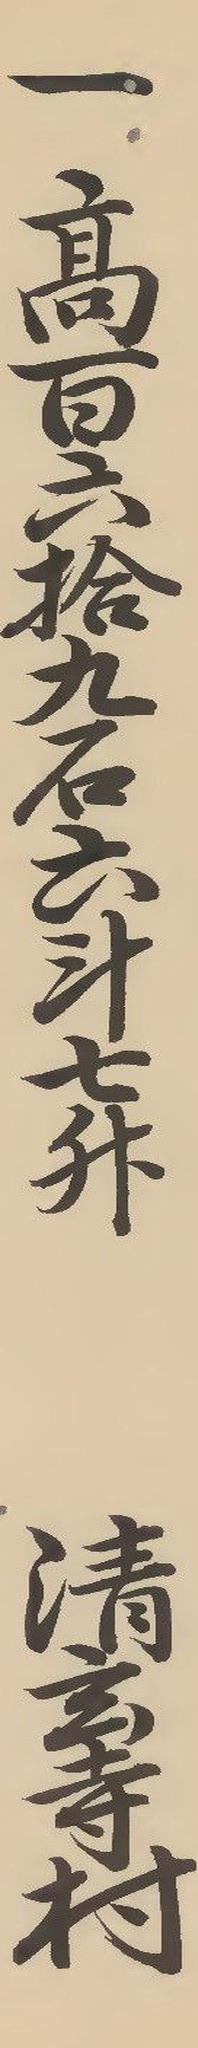一高百六拾九石六斗七升清玄寺村
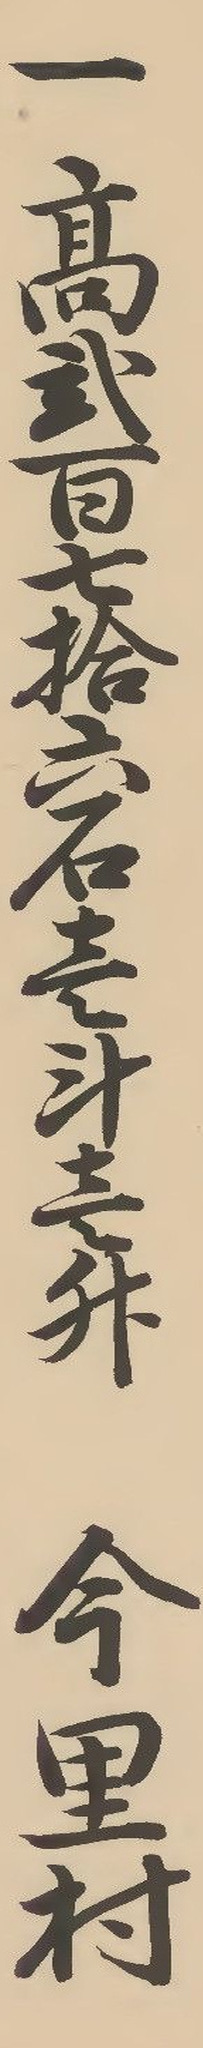一高弐百七拾六石壱斗壱升今里村
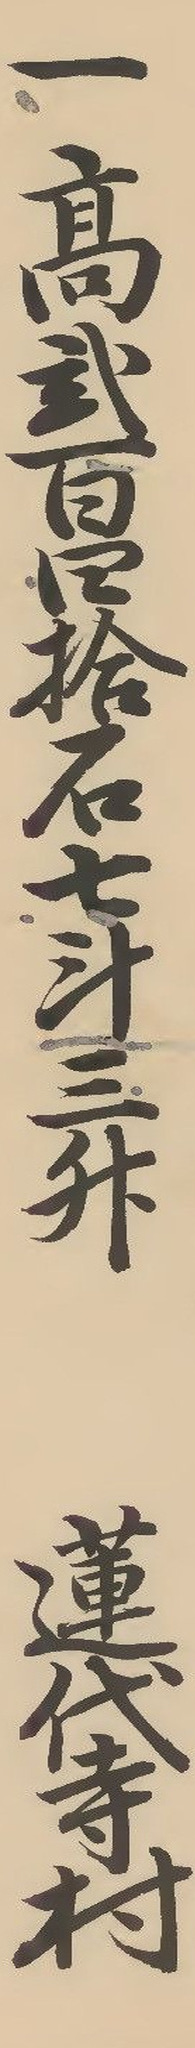一高弐百四拾石七斗三升蓮代寺村

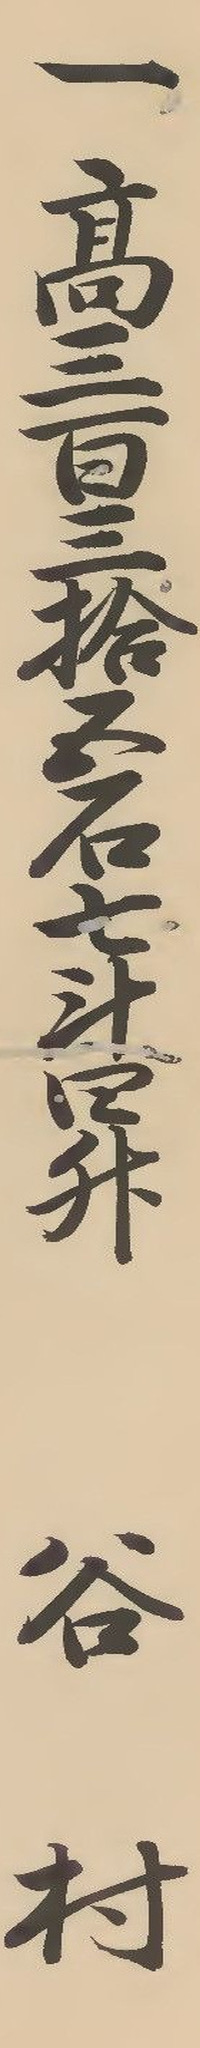一高三百三拾五石七斗四升谷村
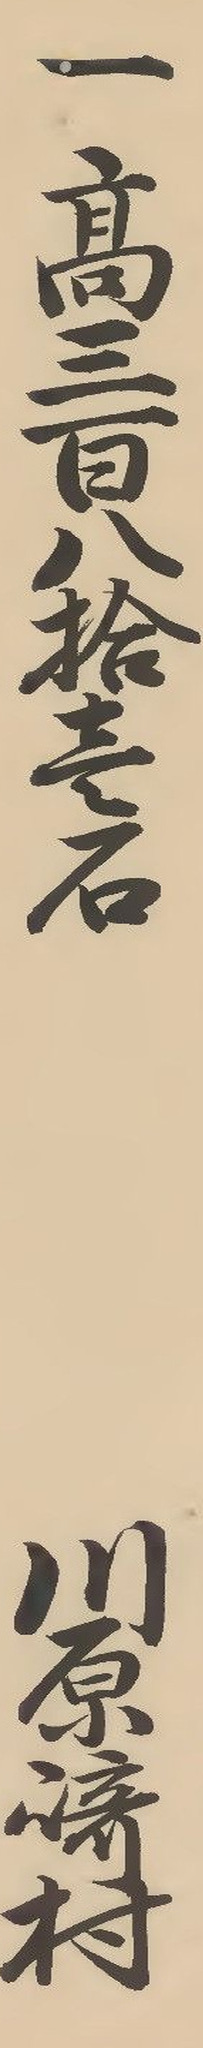一高三百八拾壱石川原崎村
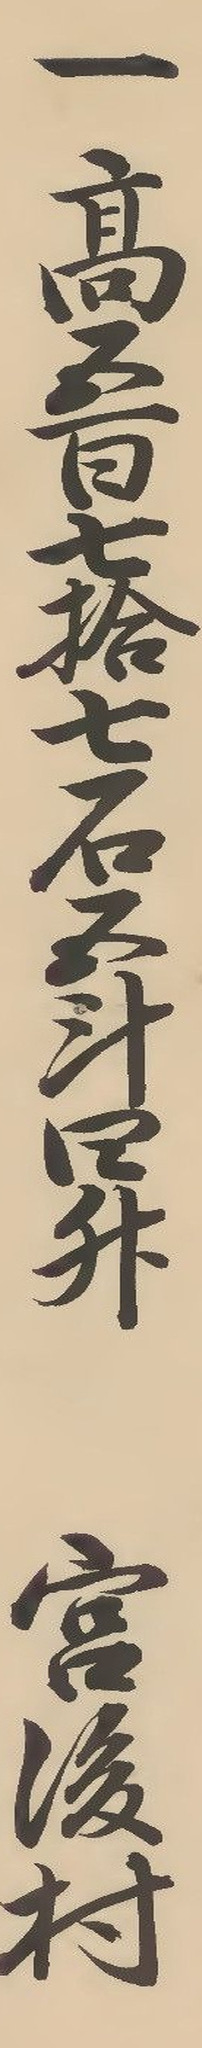一高五百七拾七石五斗四升宮後村
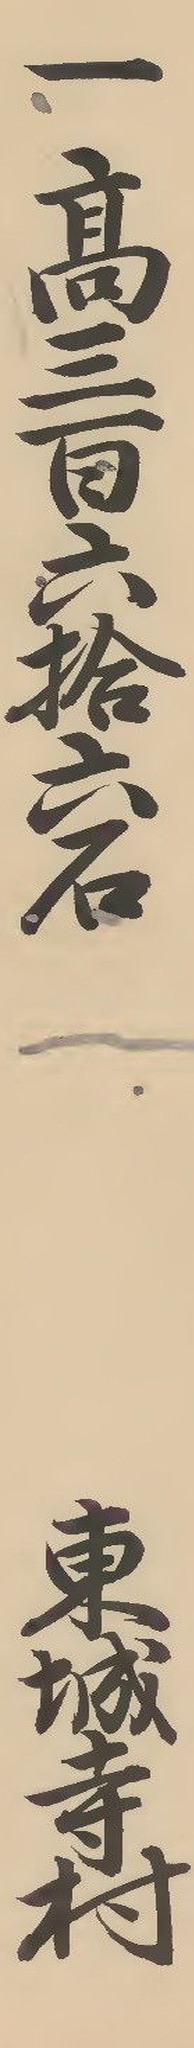一高三百六拾六石東城寺村

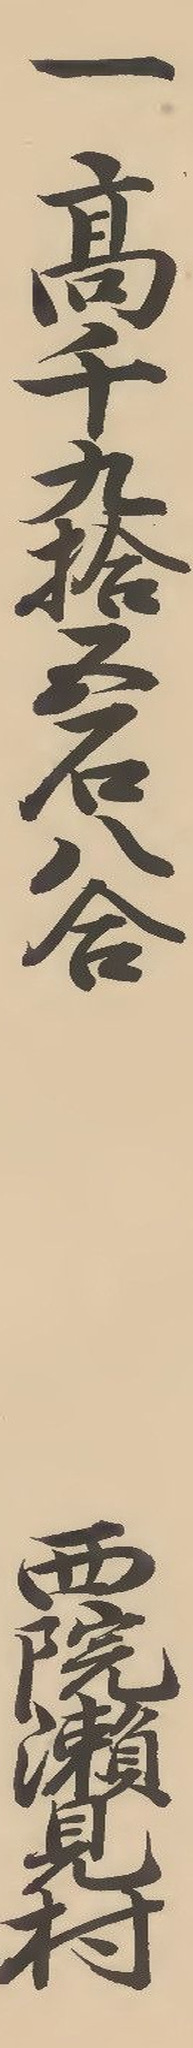一高千九拾五石八合西院瀬見村
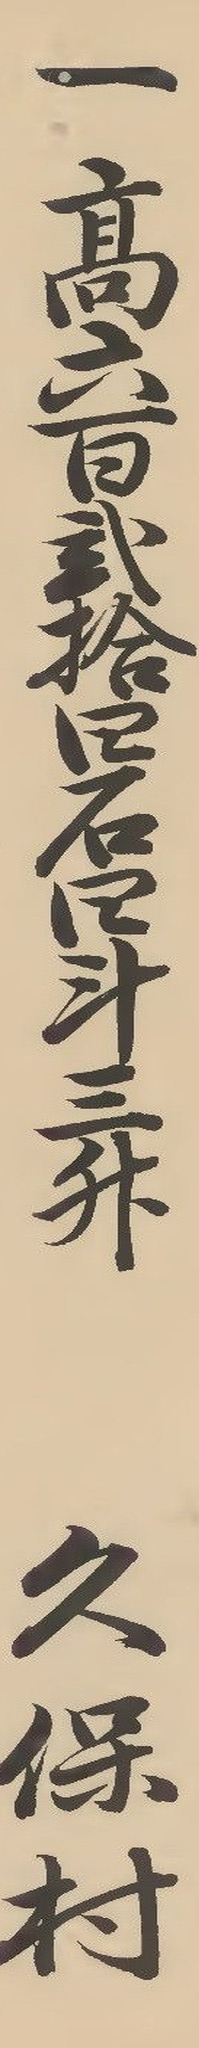一高六百弐拾四石四斗三升久保村
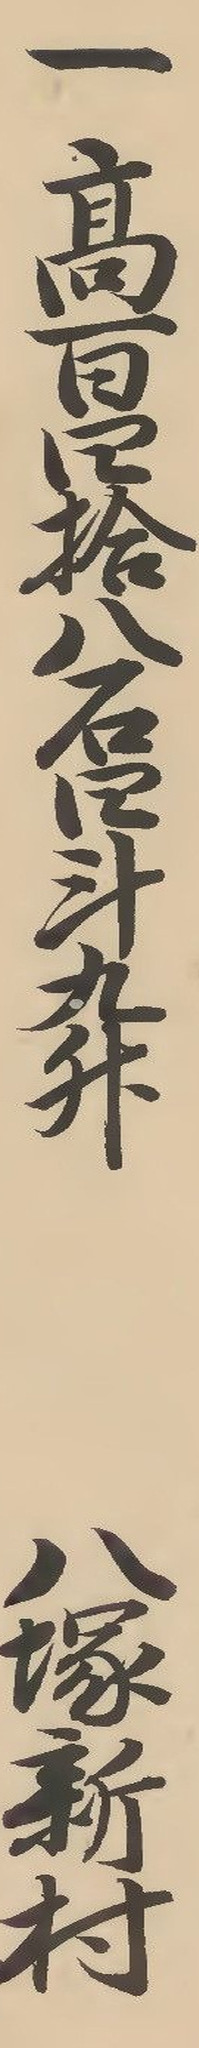一高百四拾八石四斗九升八塚新村
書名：越中国郷帳
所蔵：国立公文書館 National Archives of Japan
